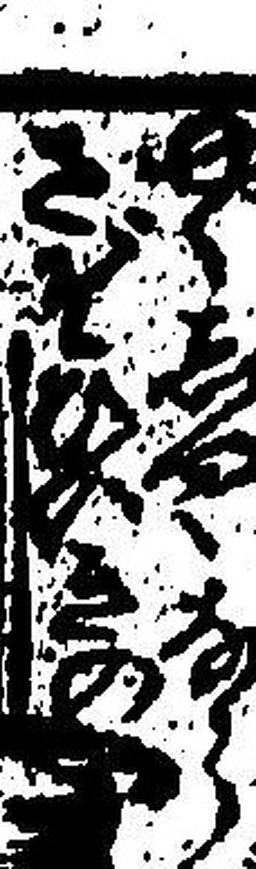さぞひいきの
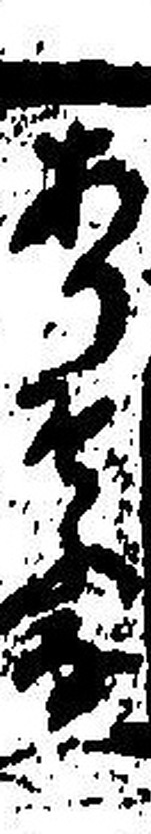ありそふな
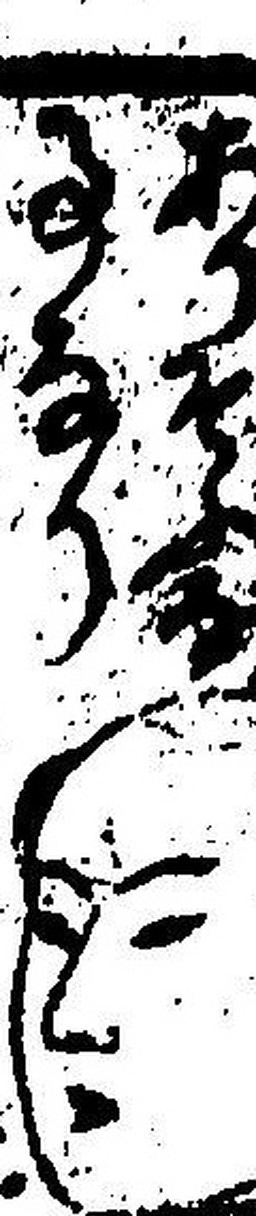事なり
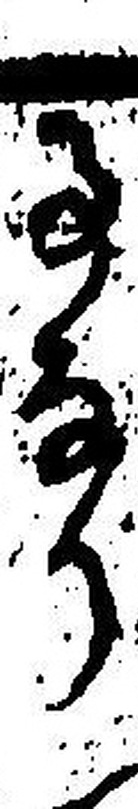事なり
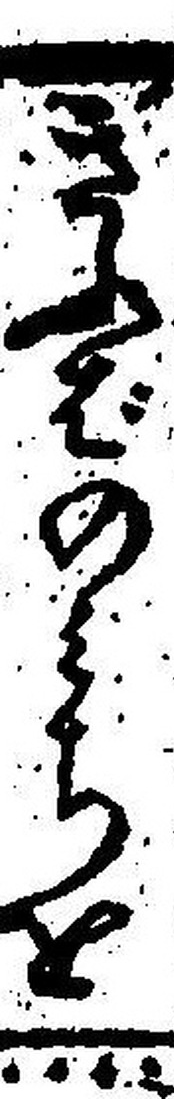きふばのみちを
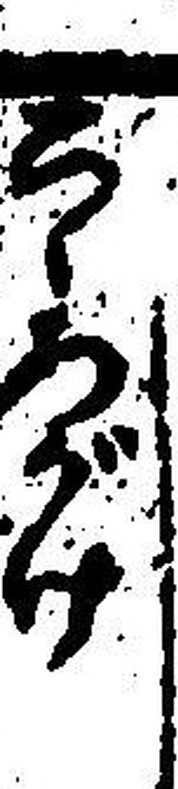こゝろがけ
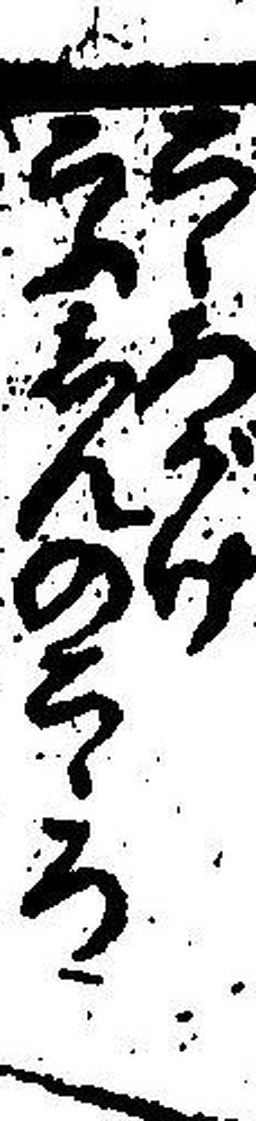こふしんのこゝろ
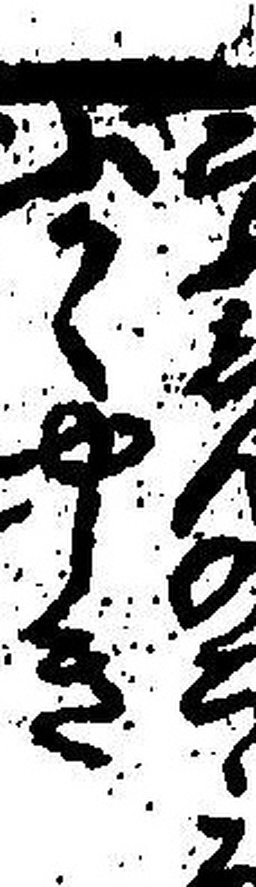ふかくやしき
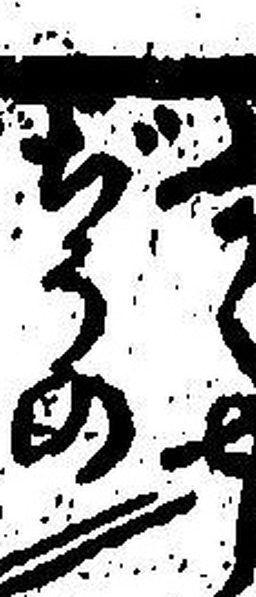じうの
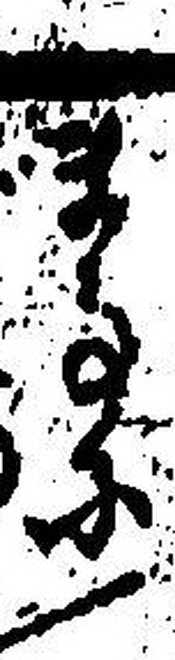ま事に
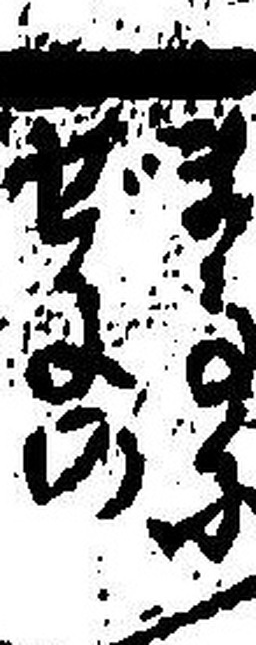ぜにの
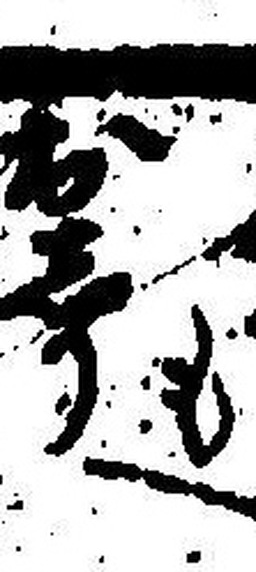おしり
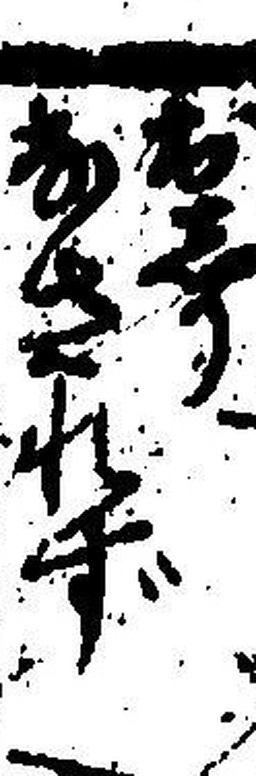なされず
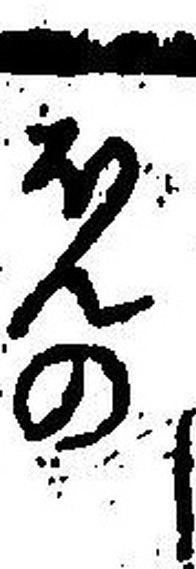ほんの
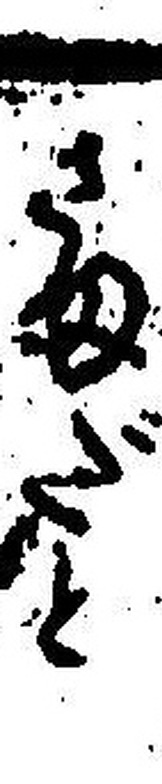さまだと
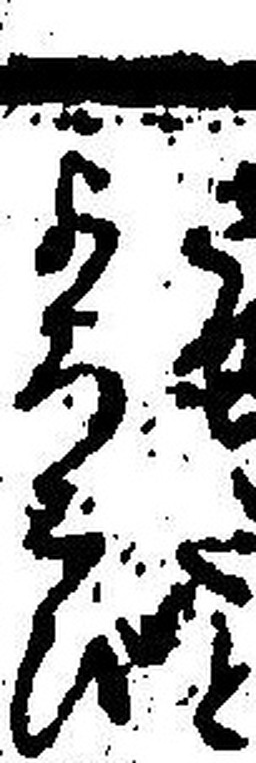よろこび
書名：御代参牛時詣 / 市場通笑作
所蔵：東京大学総合図書館 General Library in the University of Tokyo, JAPAN
